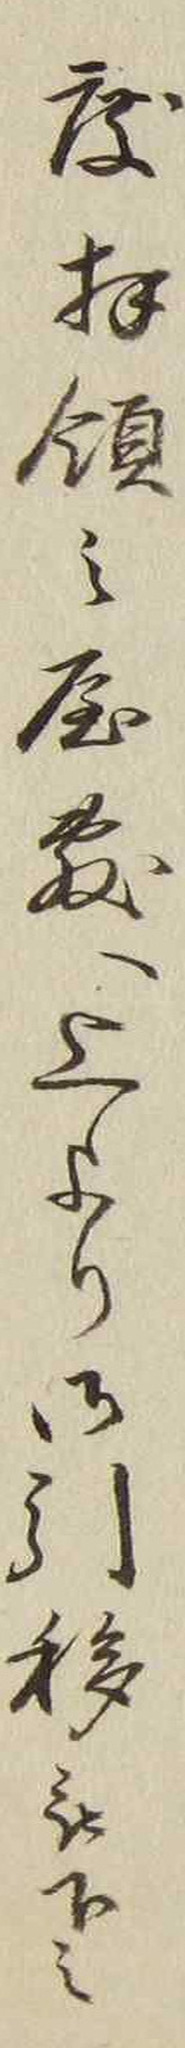度拝領之屋敷へ上より御引移被下之

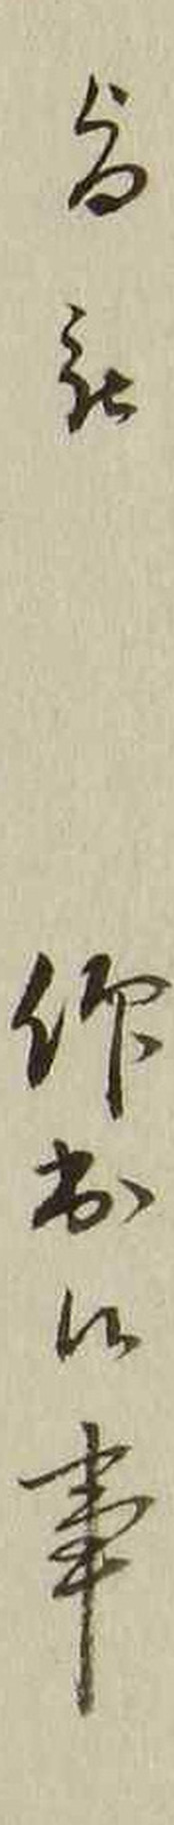旨被仰出候事
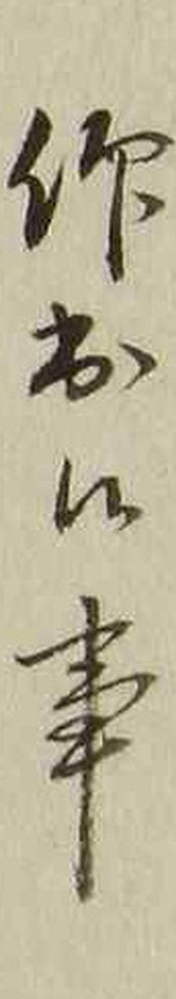仰出候事
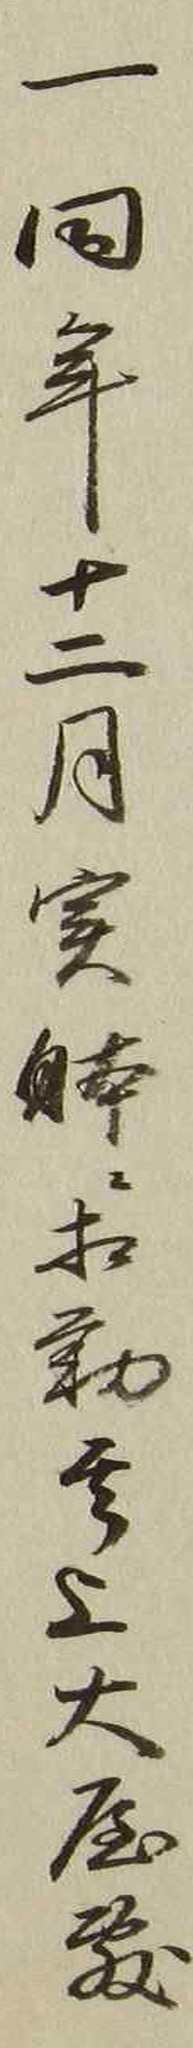一同年十二月実体ニ相勤其上大屋敷
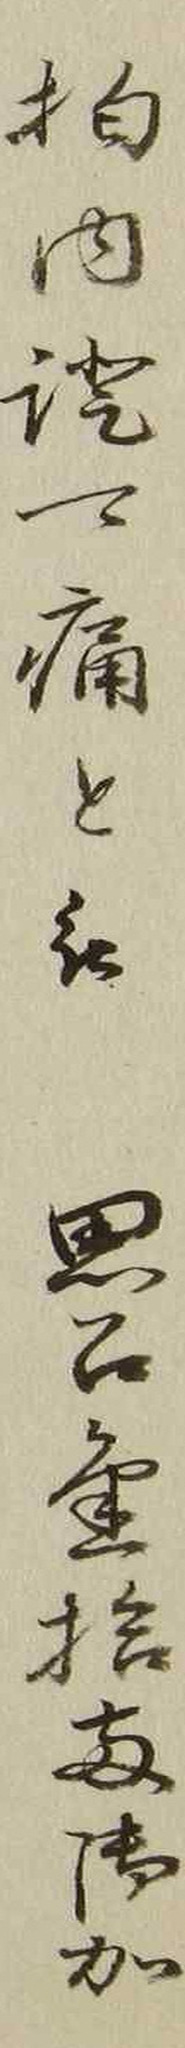拘内証可痛と被思召金拾両御加
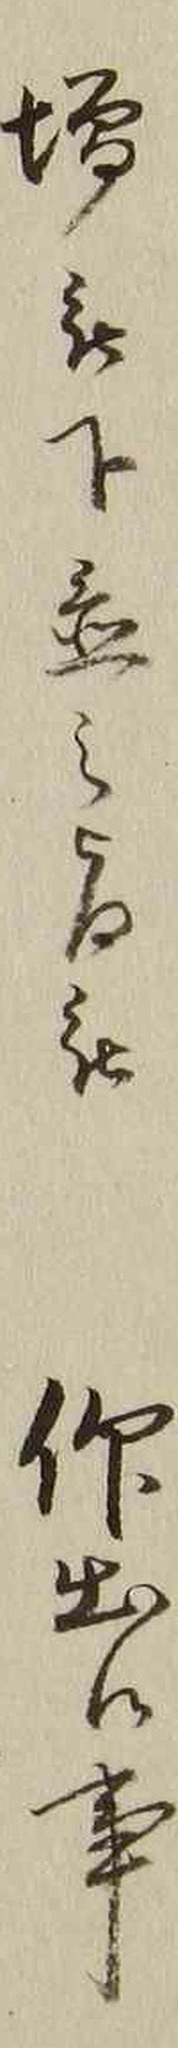増被下置之旨被仰出候事
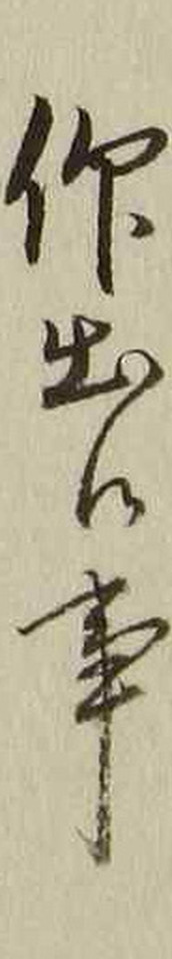仰出候事
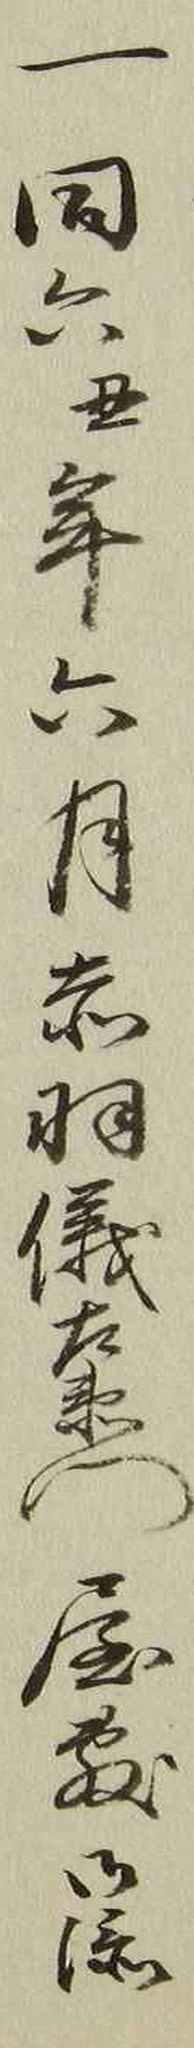一同六丑年六月赤羽儀左衛門屋敷御添
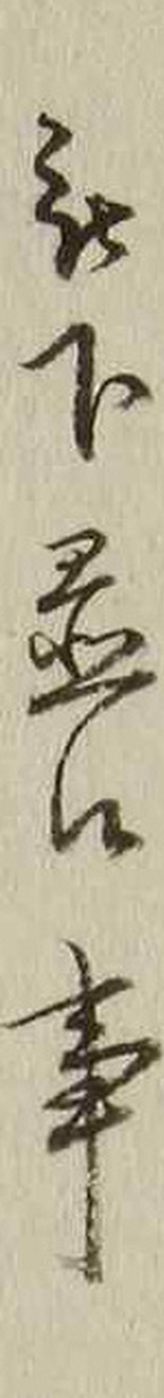被下置候事
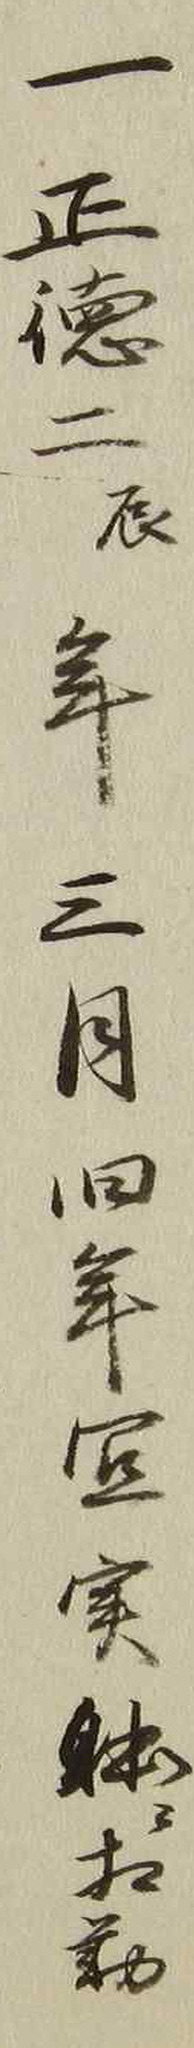一正徳二辰年三月旧年宜実体に相勤
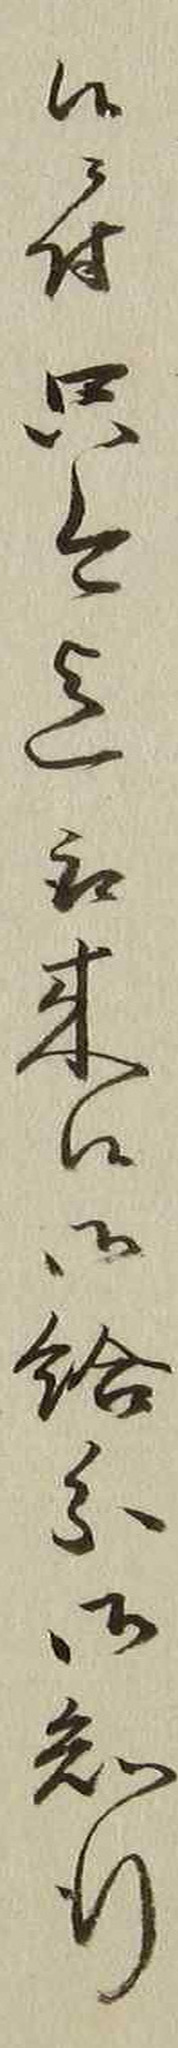候に付只今迄取来候御給分御知行
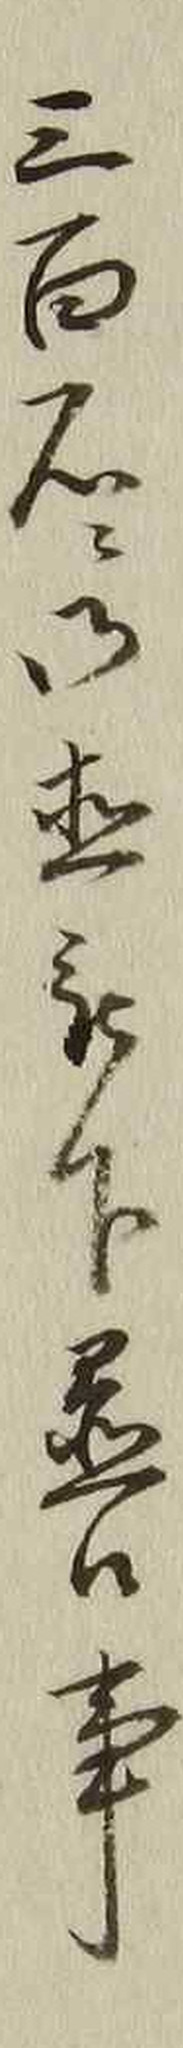三百石に御直被下置候事
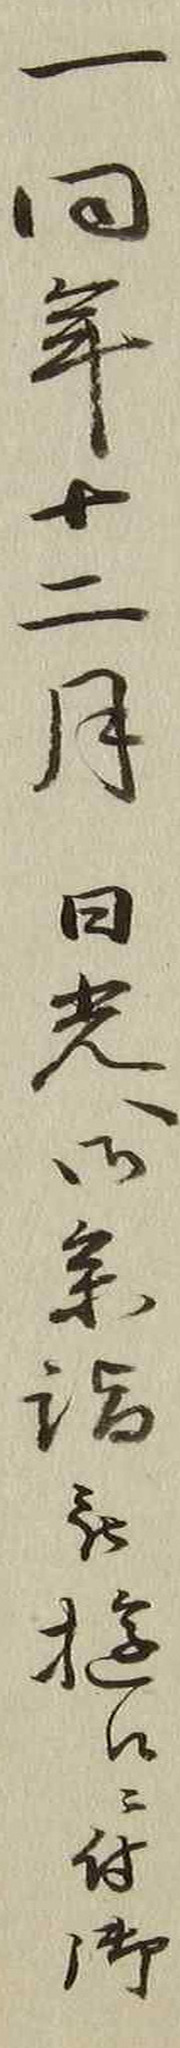一同年十二月日光へ御参詣被遊候に付御
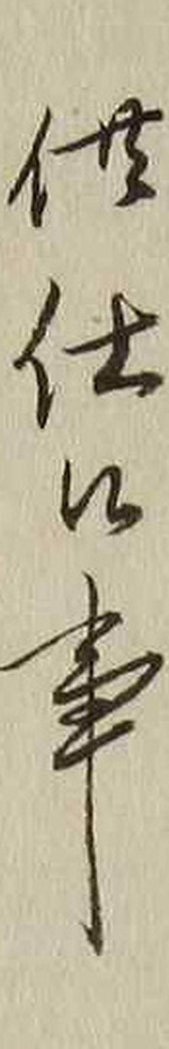供仕候事
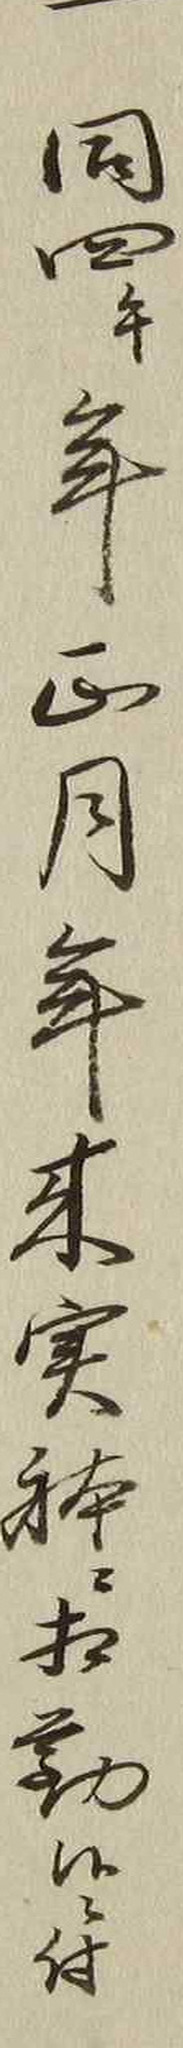一同四午年正月年来実体に相勤候に付
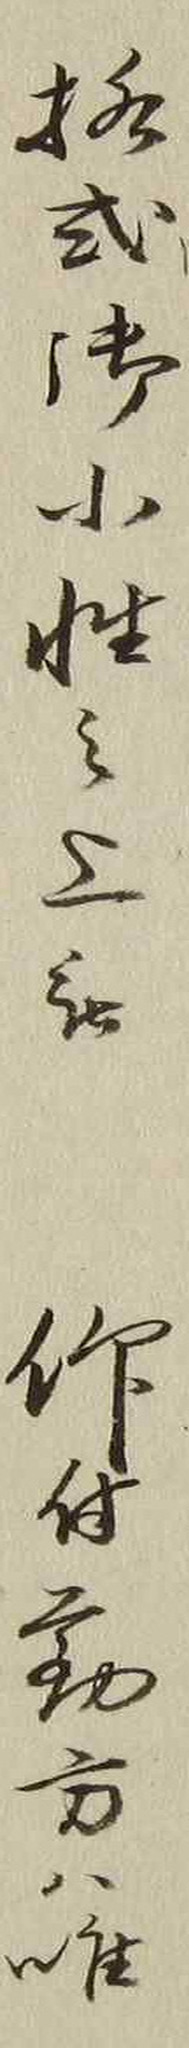格或御小性之上被仰付勤方は唯
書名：諸士系譜　巻之133　た之部9
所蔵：会津若松市立会津図書館
